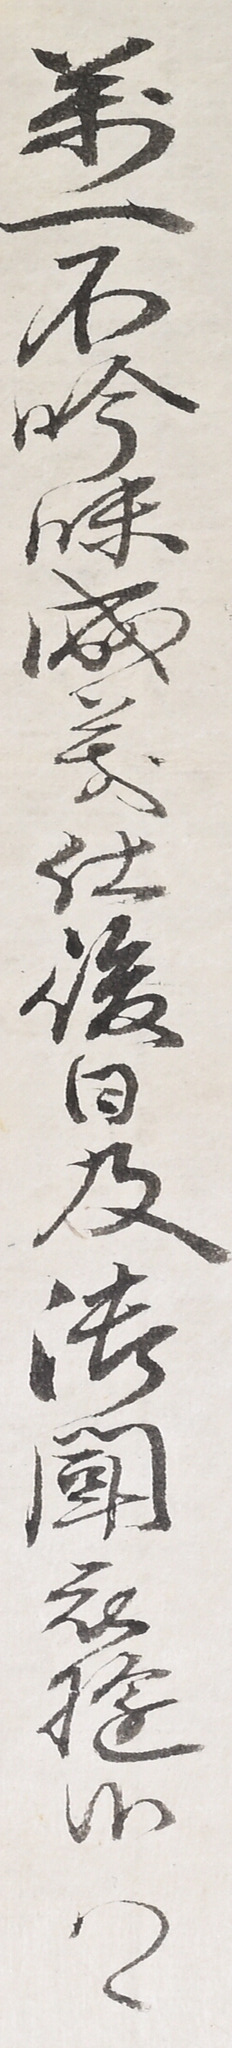万一不吟味成義仕後日及御聞被遊候ハヽ
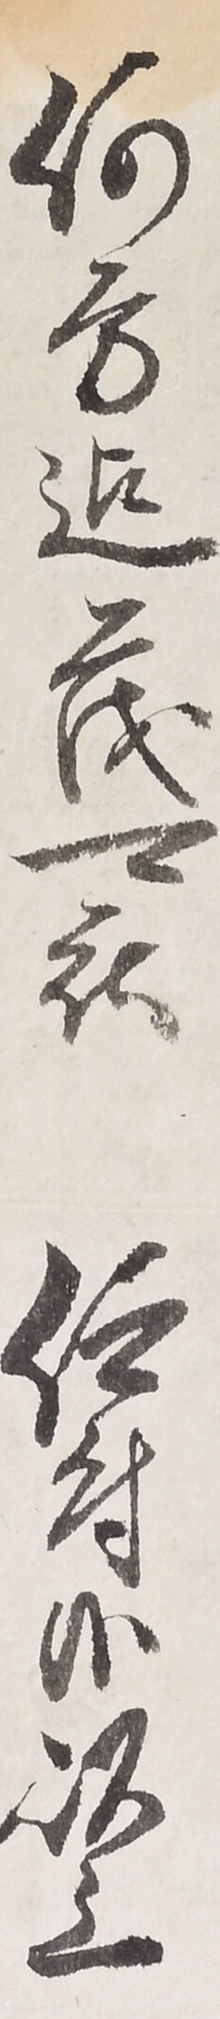何方迄も可被仰付候以上
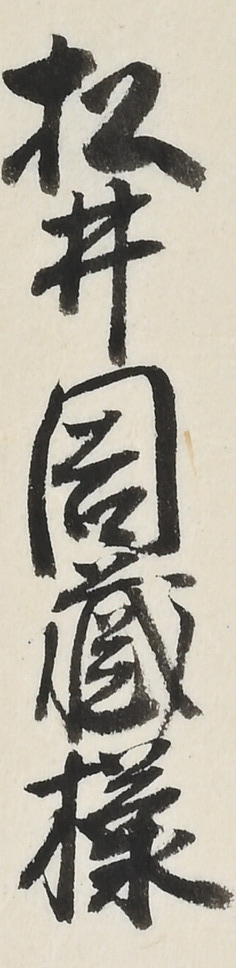松井周蔵様
